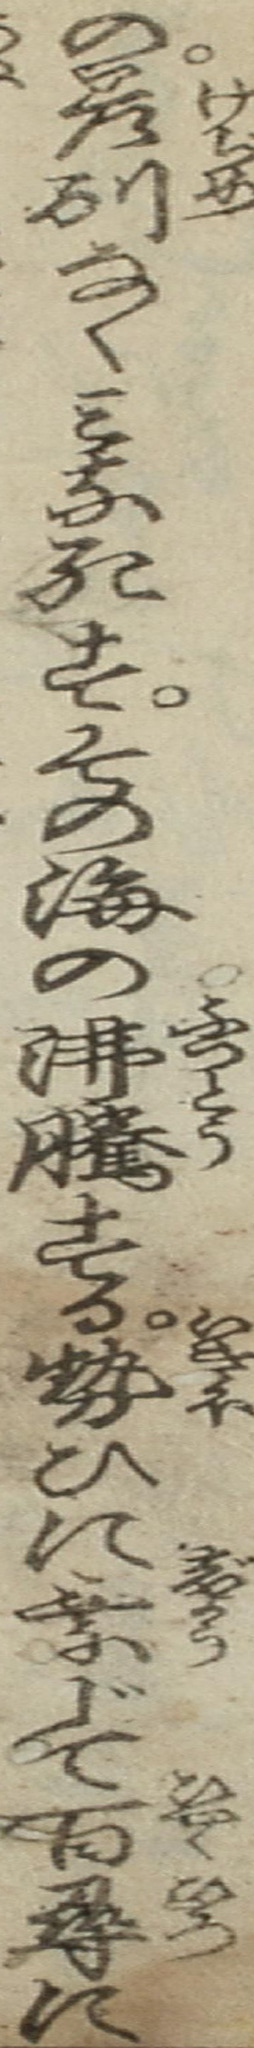の。差別なくみな死す。その海の沸騰する。勢ひに乗じて百尋に
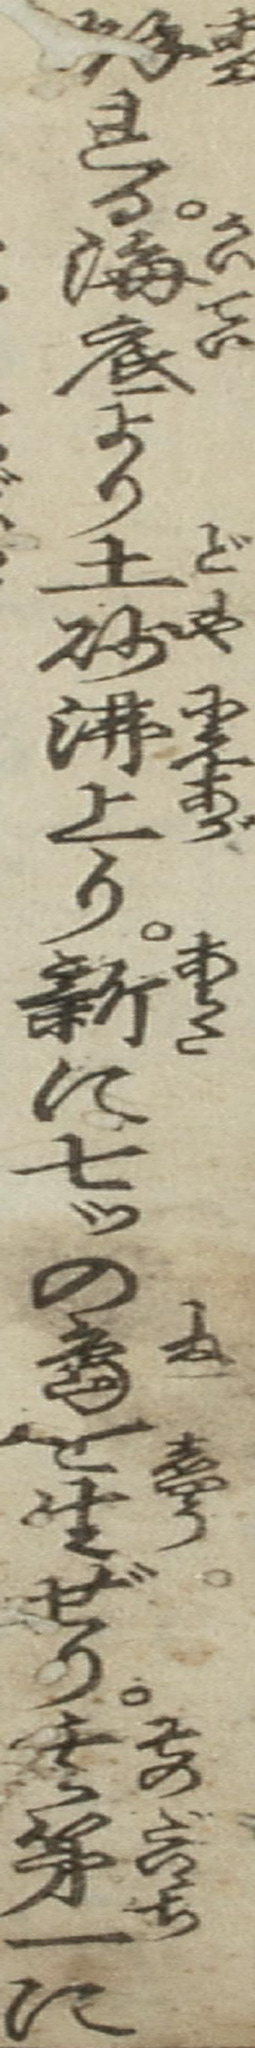餘れる。海底より土砂沸上り。新に七ッの島を生ぜり。其第一に
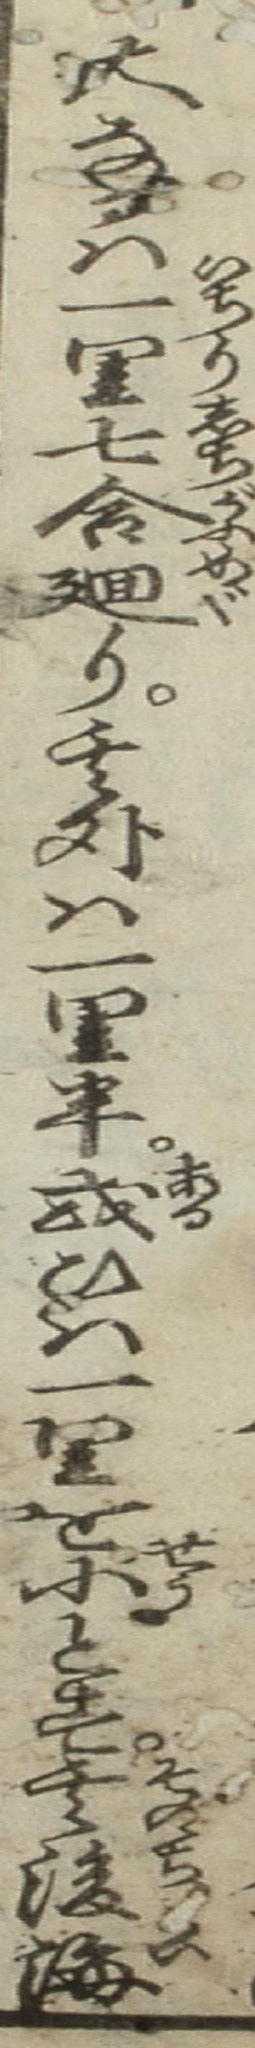大なすは一里七合迴り。其外は一里半。或ひは一里を小とす。其後海
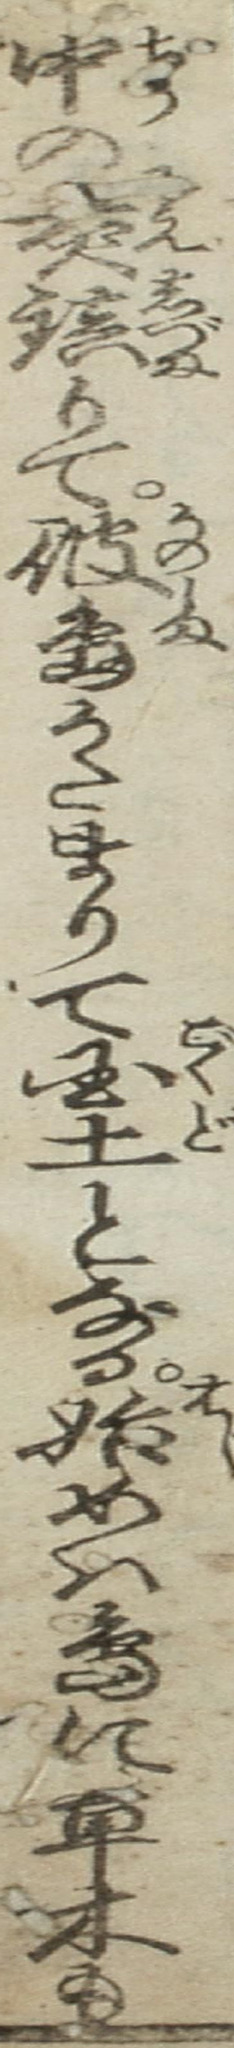中の煮鎮りて。彼島かたまりて国土となる。始めは島に草木も
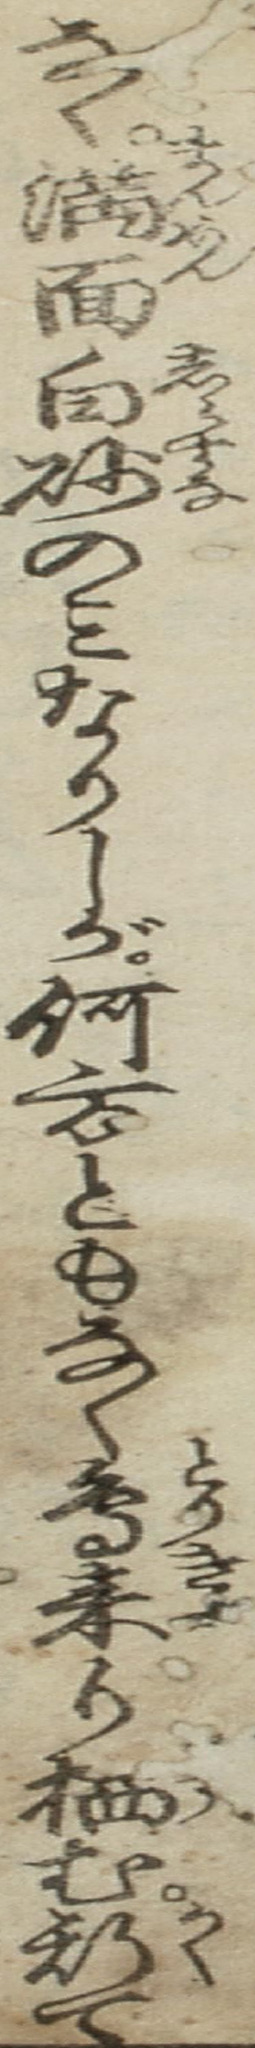なく。満面白砂のみなりしが。何方ともなく鳥来り栖む。斯て
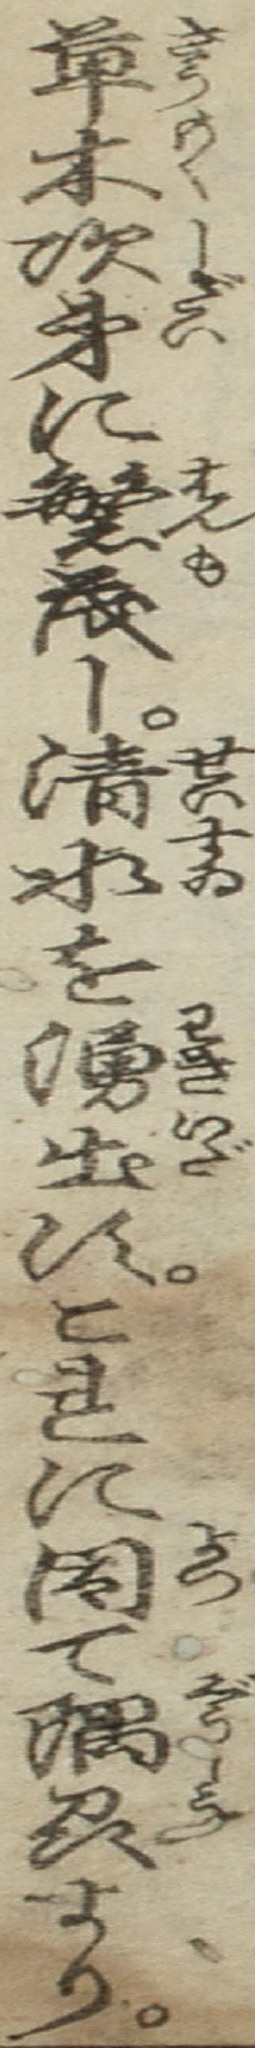草木次第に繁茂し。清水を湧出す。これに因て隅州より。
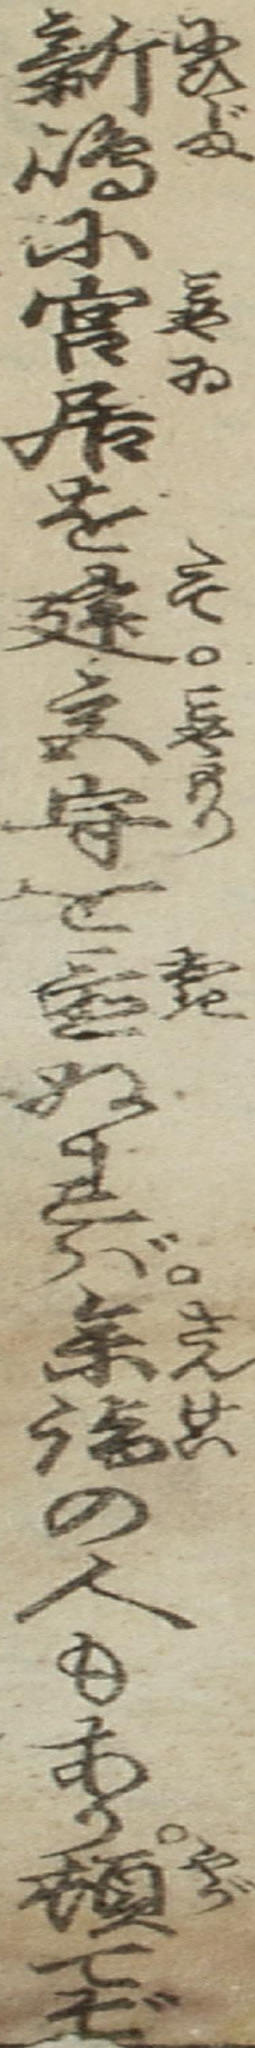新嶋に宮居を建。宮守を置ぬれば。参詣の人もあり。頓てぞ
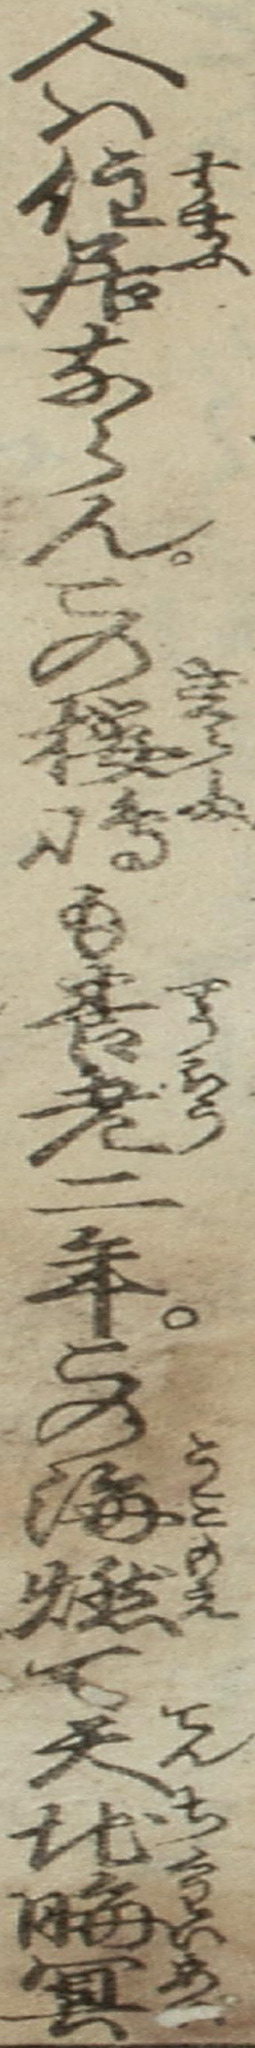人は住居ならん。この桜嶋も養老二年。この海燃て天地晦冥
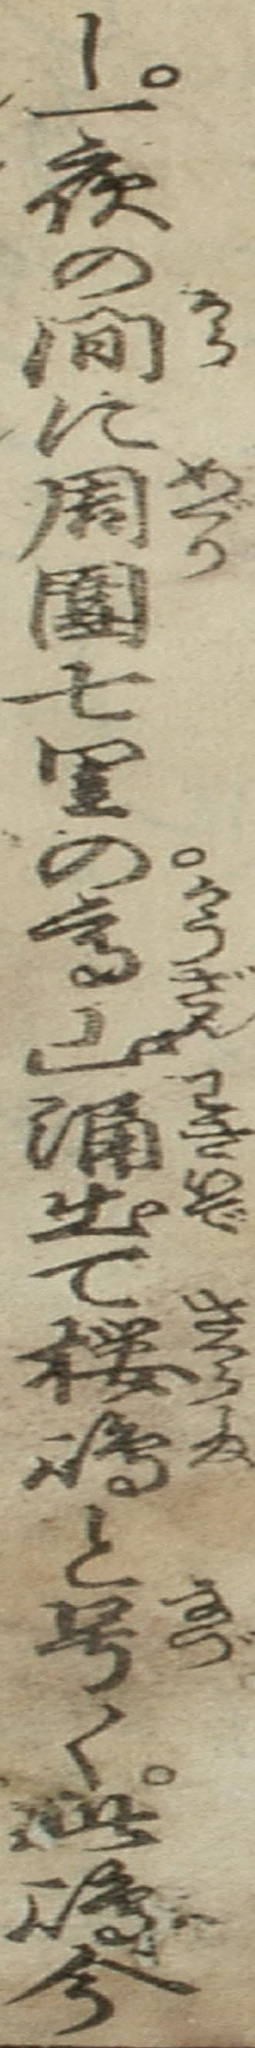し。一夜の間に周囲七里の。髙山涌出て桜嶋と号く。此嶋今
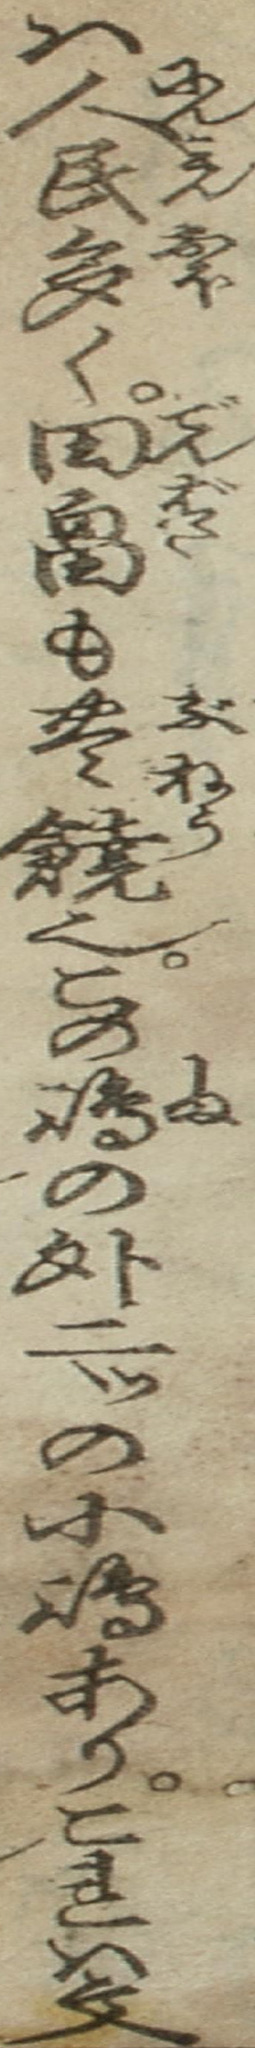は人民多く。田畠も豊饒なり。この嶋の外二ッの小嶋あり。これは文
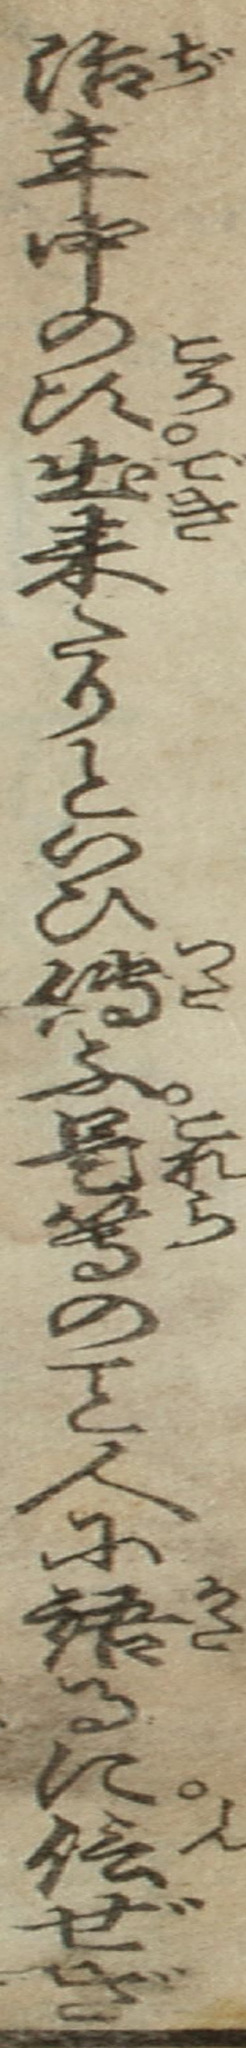治年中の頃。出来たりといひ伝ふ。是等のこと人に語るに信ぜざ
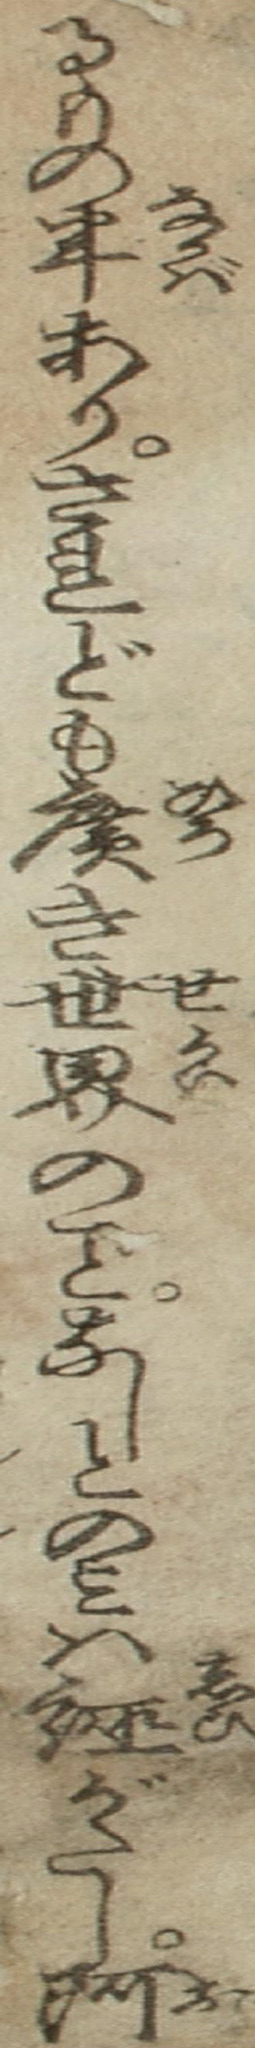るもの半あり。されども広き世界のこと。なしとのみは強がたし。阿
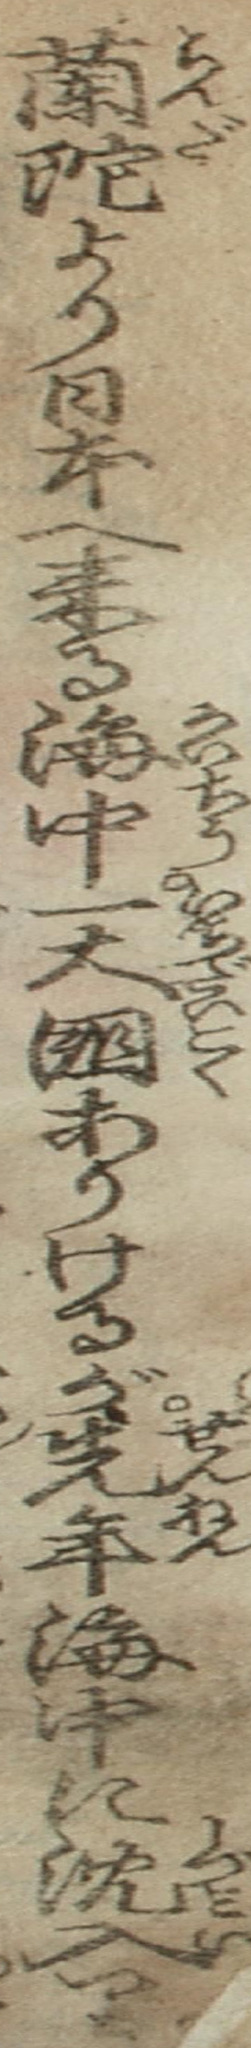蘭陀より日本へ来る海中一大国ありけるが。先年海中に沈入り。
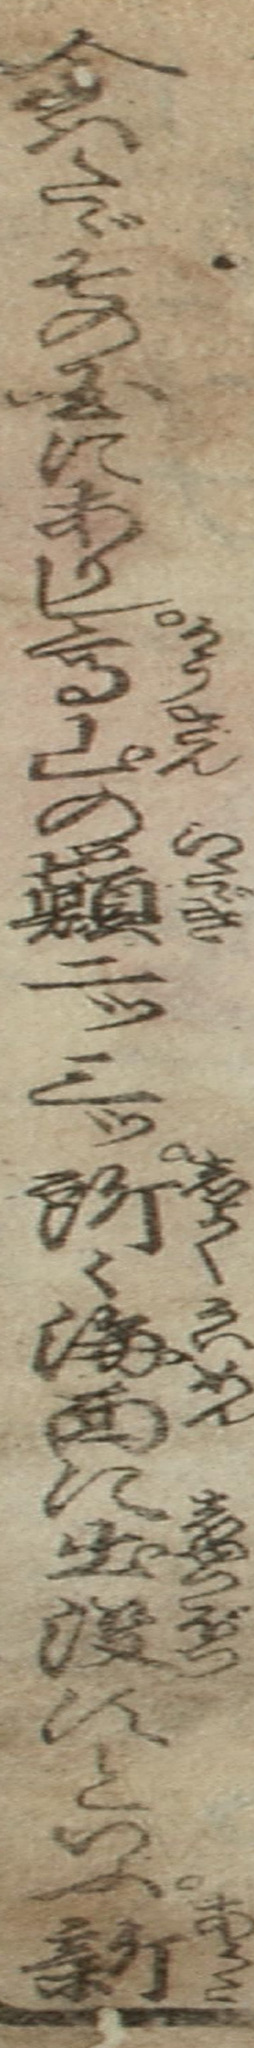今はたゞその国にありし。髙山の巓二ッ三ッ。所〻海面に出没すといふ。新

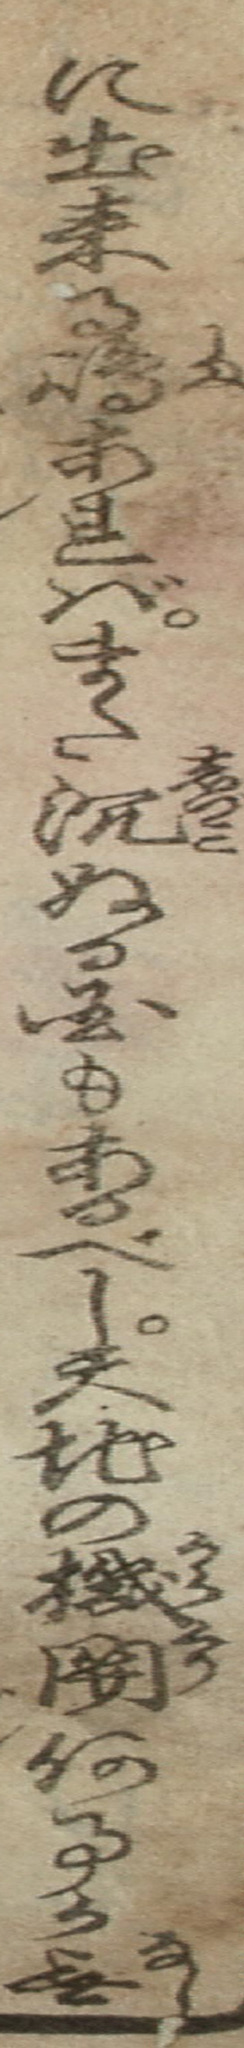に出来る嶋あれば。また沈ぬる国もあるべし。天地の機開何事か無
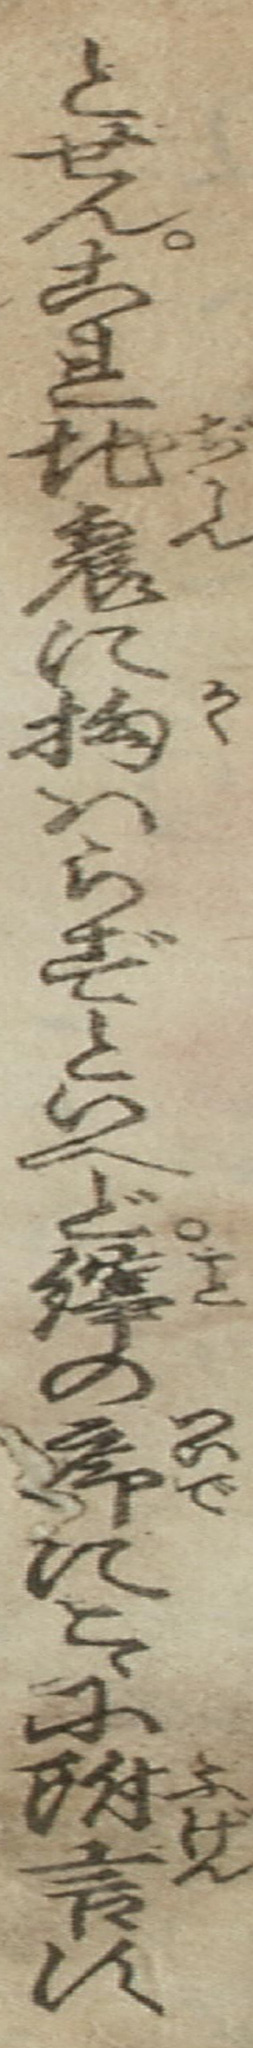とせん。これ地震に拘はらずといへど。縡の序にこゝに附言す
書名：安政見聞録　中
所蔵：東京大学地震研究所図書室 Earthquake Research Institute Library, The University of Tokyo, JAPAN
